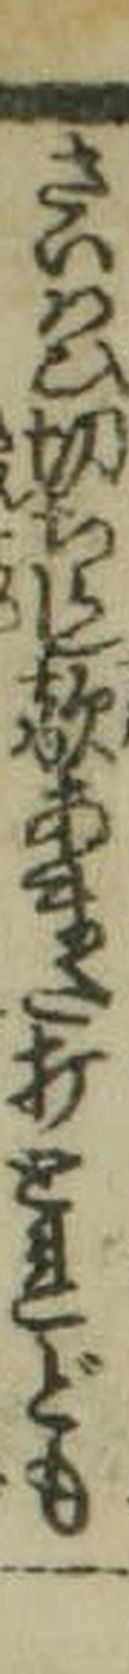さいはひ切ちらし敵あまた打とれども
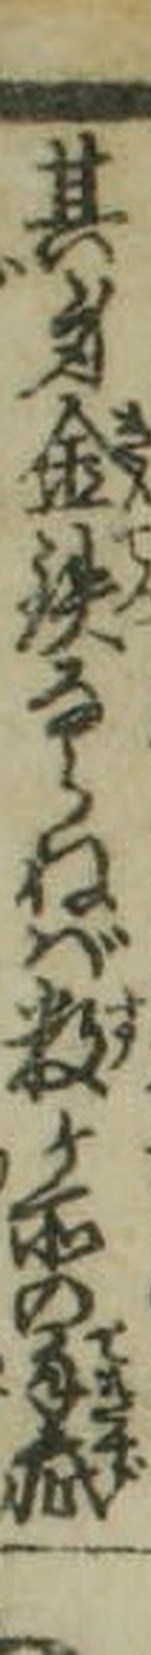其身金鉄ならねば数ヶ所の手疵
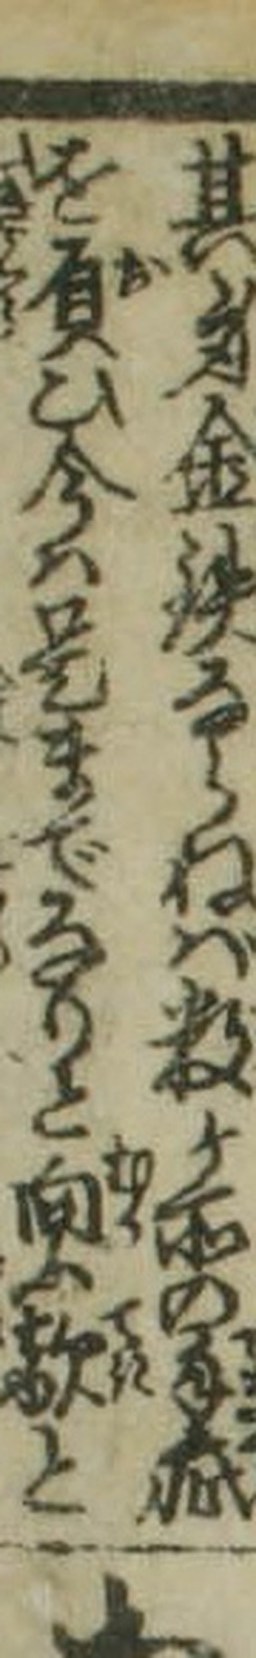を負ひ今は是までなりと向ふ敵と
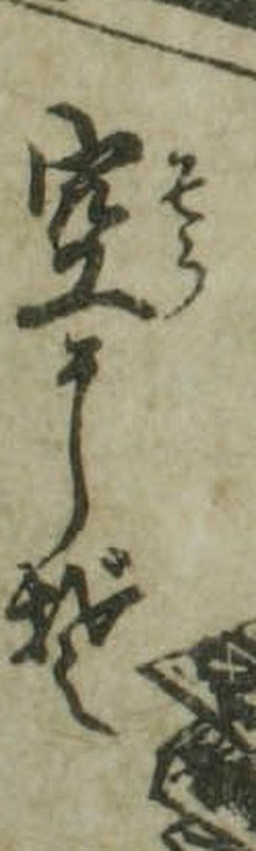空にぞ
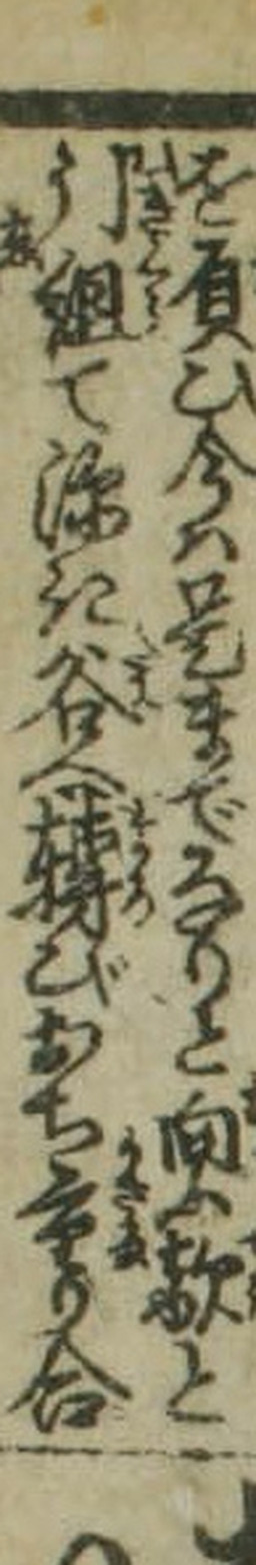引組て深き谷へ転びおち重り合
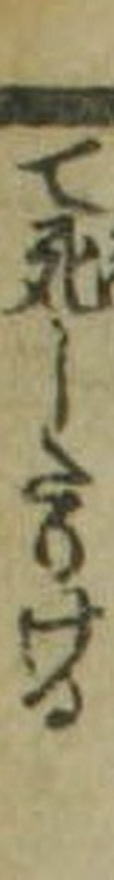て死したりける
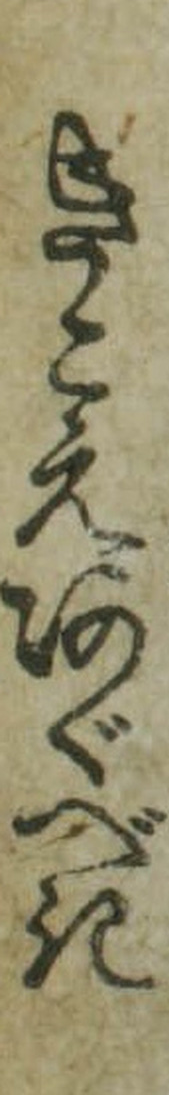きこえあぐべき

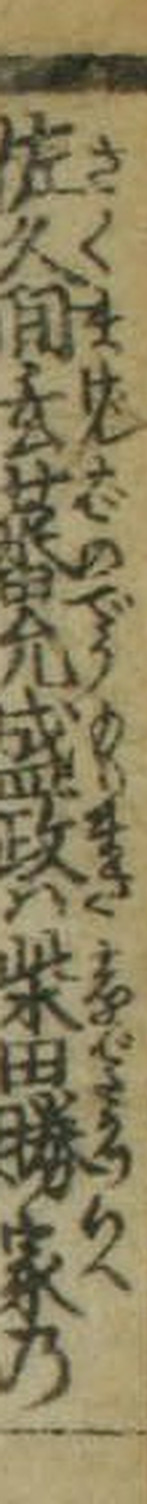佐久間玄蕃允盛政は柴田勝家の
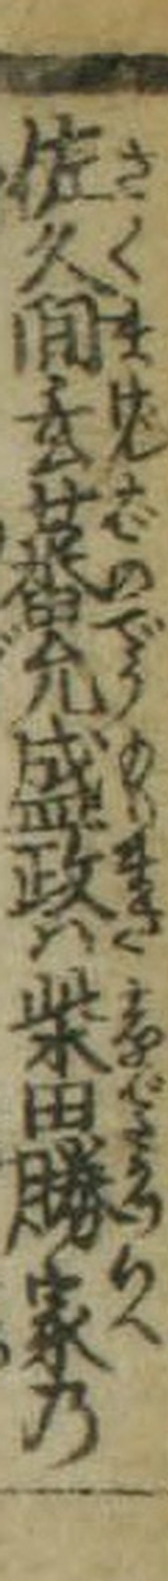佐久間玄蕃允盛政は柴田勝家の
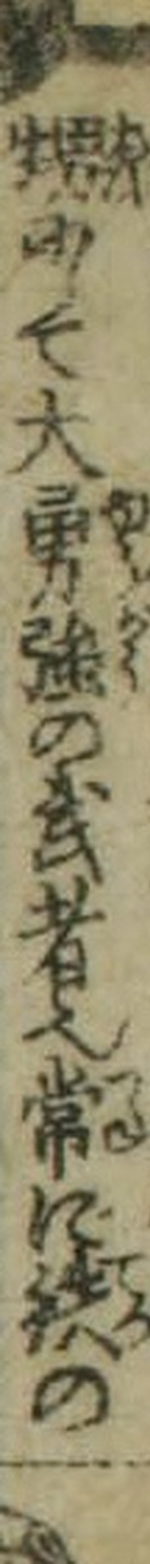甥にて大勇強の武者也常に鉄の
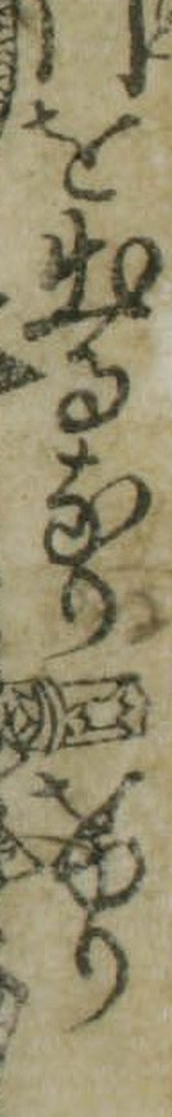門を出るなりけり
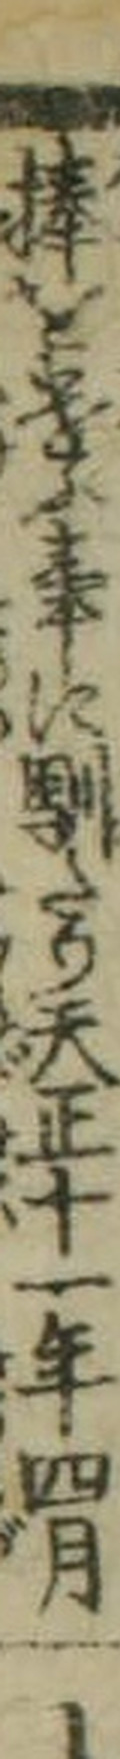棒を遣ふ事に馴たり天正十一年四月
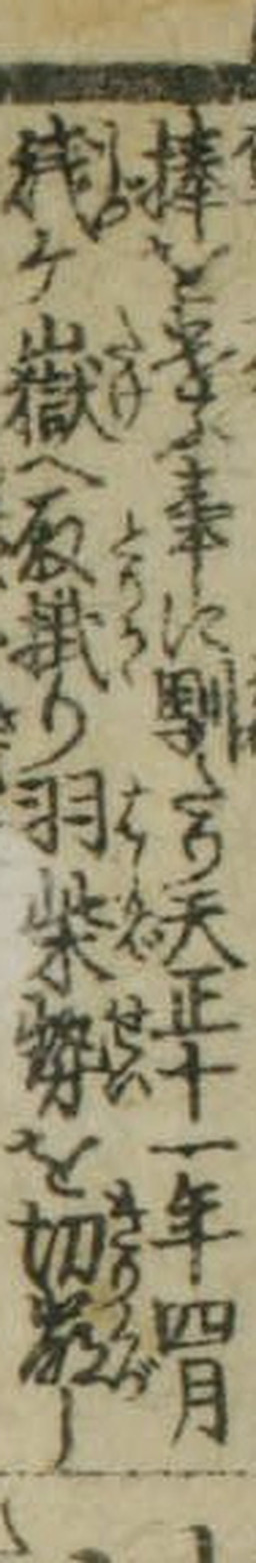賤ヶ嶽へ取掛り羽柴勢を切崩し
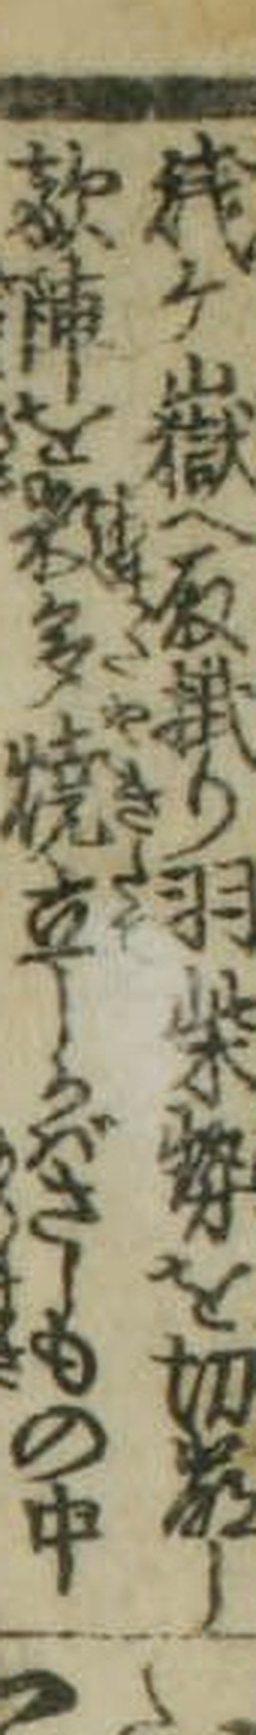敵陣を数多焼立しかばさしもの中
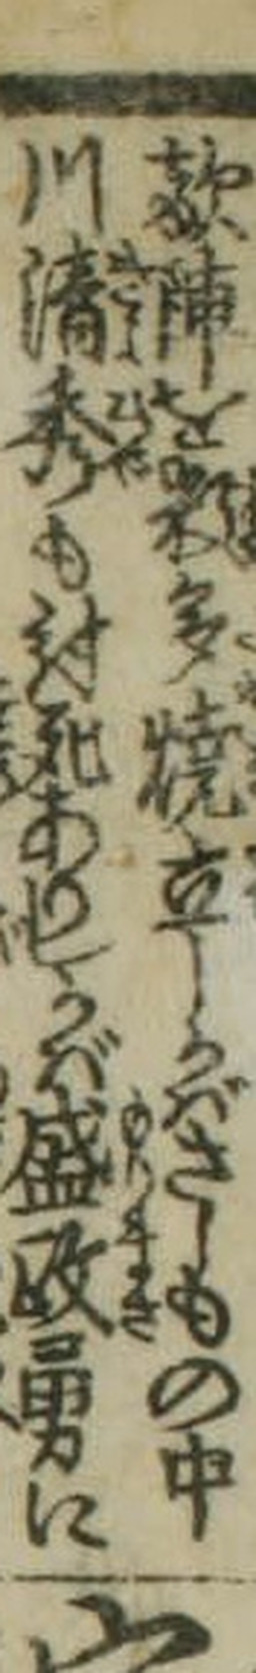川清秀も討死ありしかば盛政勇に
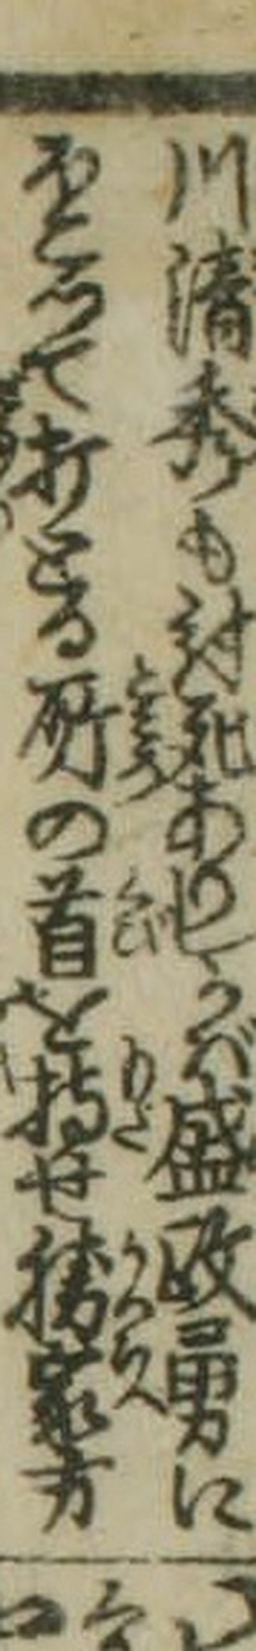ほこつて打とる所の首を持せ勝家方
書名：續英雄百人一首
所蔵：東京学芸大学附属図書館
